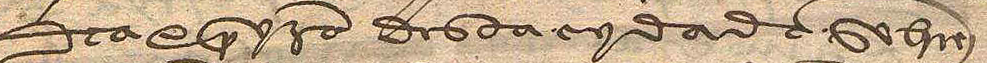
dea e p̄yzā desta cydade sobre
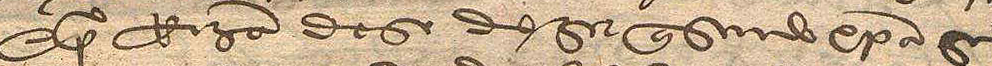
e p̄o Rezā de se dyzer q̄ sendo xpā se
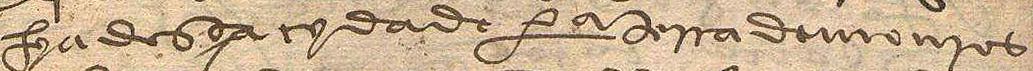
hya desta cydade ꝑa terra de mouros
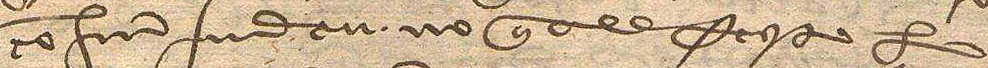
c̄o hū Judeu. no q̄all feyto ho
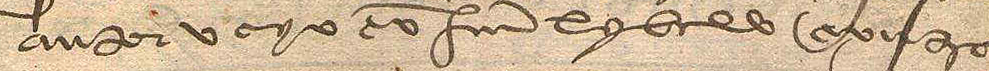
autor veyo c̄o hū lybello contra
